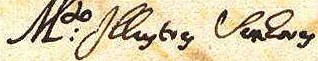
Mto: Jllustres Senhores
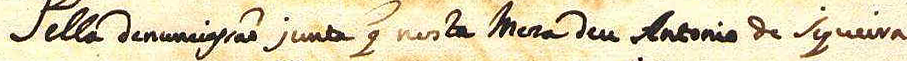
Pella denunciassaõ junta q̄ nesta Meza deu Antonio de Siqueira
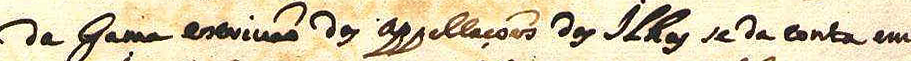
da Gama escriuaõ das appellaçoẽs das Ilhas se da conta em
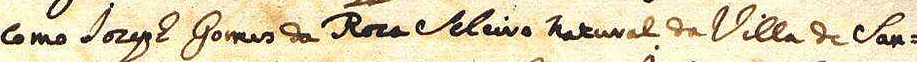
como Iozeph Gomes da Roza Seleiro natural da Villa de San
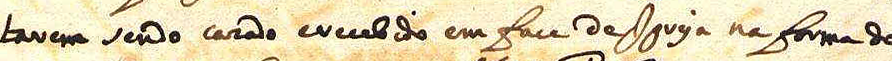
tarem sendo cazado e recebido em face de Jgreja na forma do
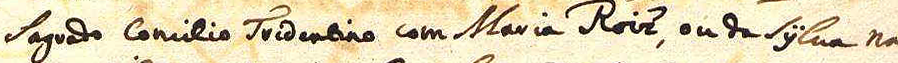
Sagrado Concilio Tridentino com Maria Roiz̄, ou da sylua na
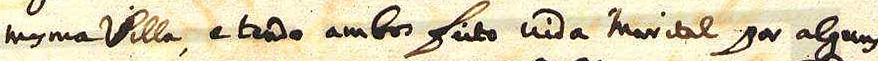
mesma Villa, e tendo ambos feito uida marital por alguns
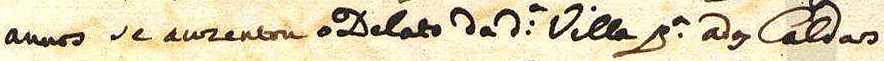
annos se auzentou o Delato da d:a Villa p.a a das Caldas
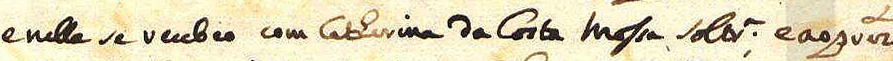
e nella se recebeo com Catherina da Costa mossa soltra., e ao prezte
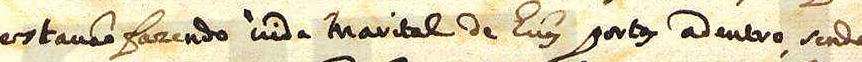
estauaõ fazendo uida marital de huas̄ portas adentro, sendo
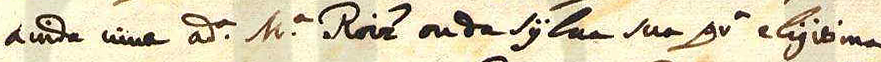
ainda uiua a da. M.a Roiz̄ ou da sylua sua pra e ligitima
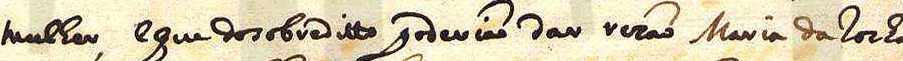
mulher, e que do sobreditto poderiaõ dar rezaõ Maria da Rocha
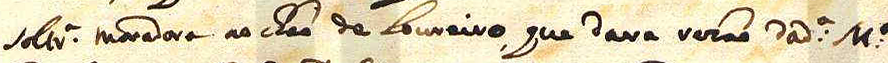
soltra. moradora ao chaõ de Loureiro, que dara rezaõ da da: Ma:
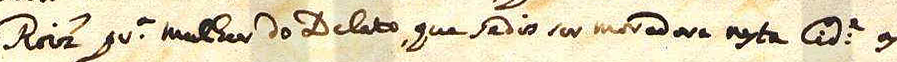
Roiz̄ pr.a mulher do Delato, que se dis ser moradora nesta Cid:e as
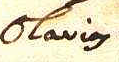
Olarias.
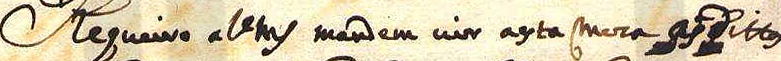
Requeiro a V ms mandem uir a esta meza as dittas
